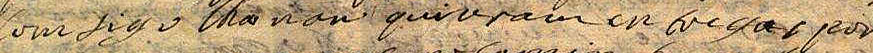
Comsigo lha nam quizeram entregar por
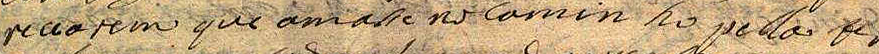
recearem que amasse no caminho pella ter
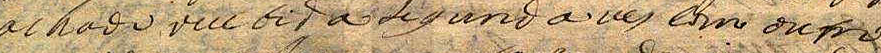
achado recebida segunda uez com outro
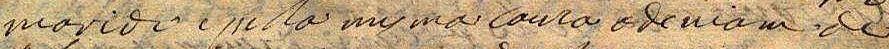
marido e pella mesma cauza a deuiam de
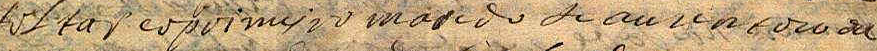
soltar e o primeiro marido se auzentou ou
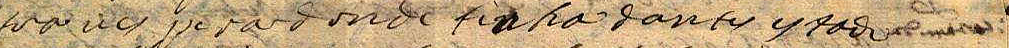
tra ues pera donde tinha dantes estado
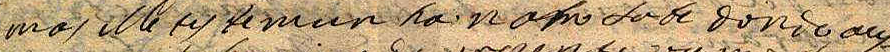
mas elle testemunha nam sabe donde acis
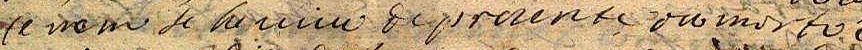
te nem se he uiuo de prezente ou morto e
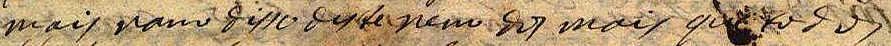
mais nam disse deste nem dos mais que todos
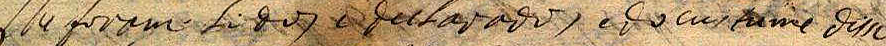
lhe foram lidos e declarados e do custume disse
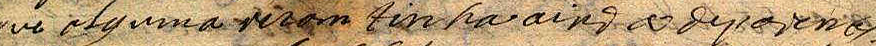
que alguma rezam tinha ainda de parentes
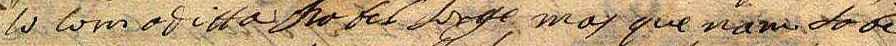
co com a ditta Izabel Iorge mas que nam sabe
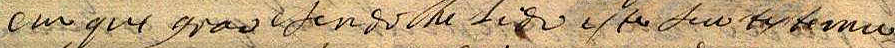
em que grao e sendolhe lido este seu testemu
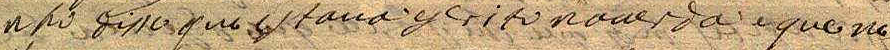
nho disse que estaua escrito na uerdade e que ne
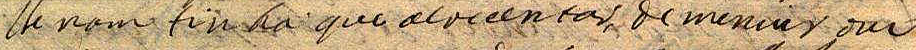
lle nam tinha que acrecentar, demenuir ou
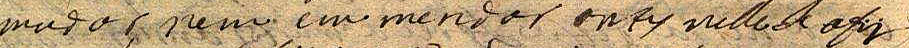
mudar, nem emmendar antes nelle se afir
